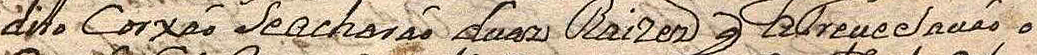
dito Corxão se acharaõ duas Raizez q̄ aTreuesavão o
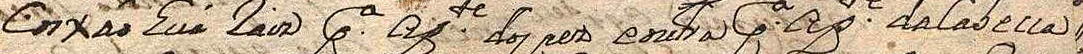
corxão huā Raiz p.a a p.te dos pez e outra p.a a p.te da cabecca
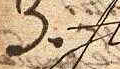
3. item
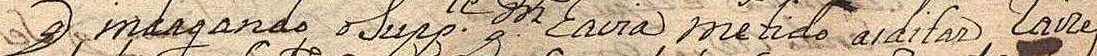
q̄ indagando o Supp.te q.m havia metido as ditaz Raizes
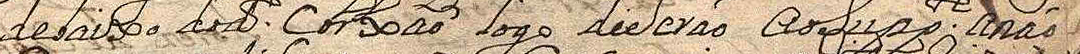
debaixo do d.to corxaõ logo diserão ao Supp.te a naõ
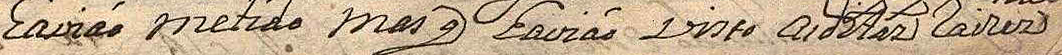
havião metido mas q̄ havião visto as ditaz Raizes
